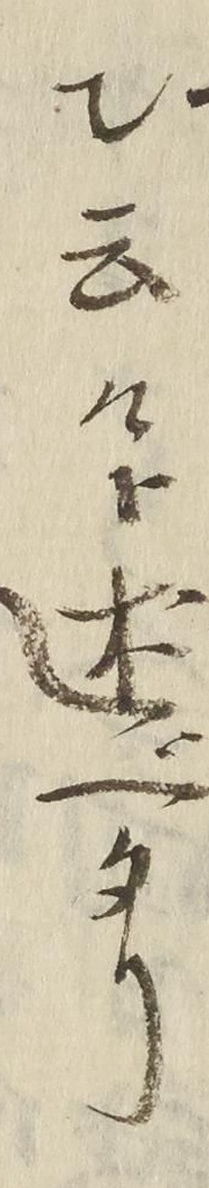れ云々ㇳ述べタリ
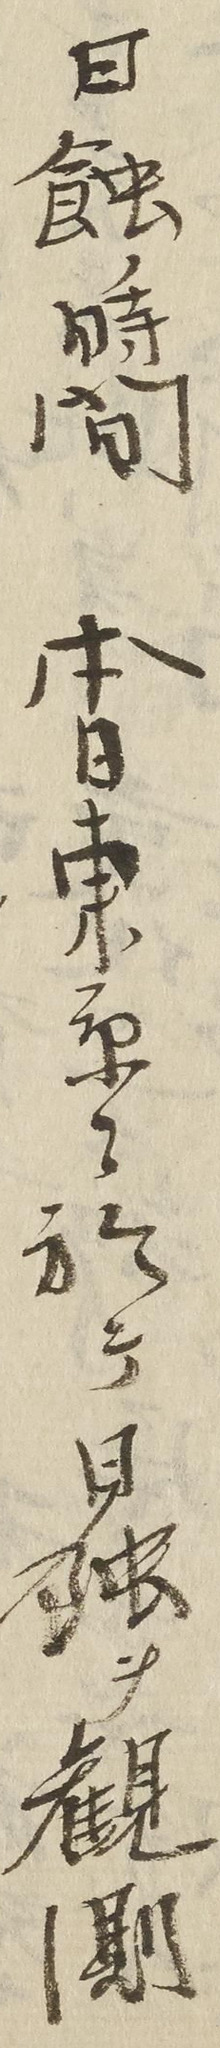日蝕ノ時間本日東京市二於テ日蝕ノ観測
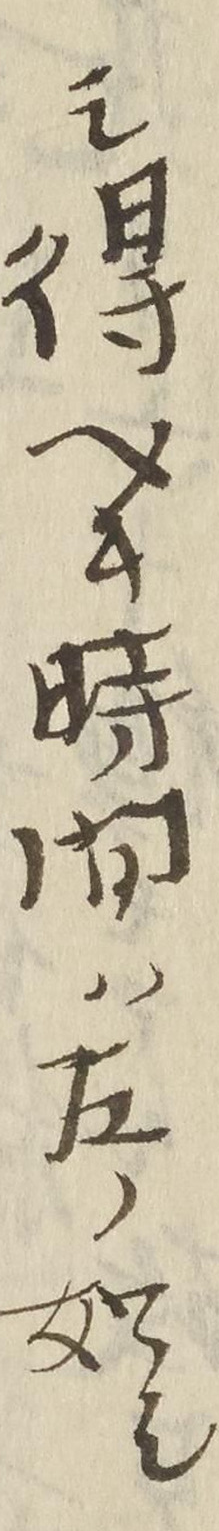得ベキ時間ハ左ノ如シ
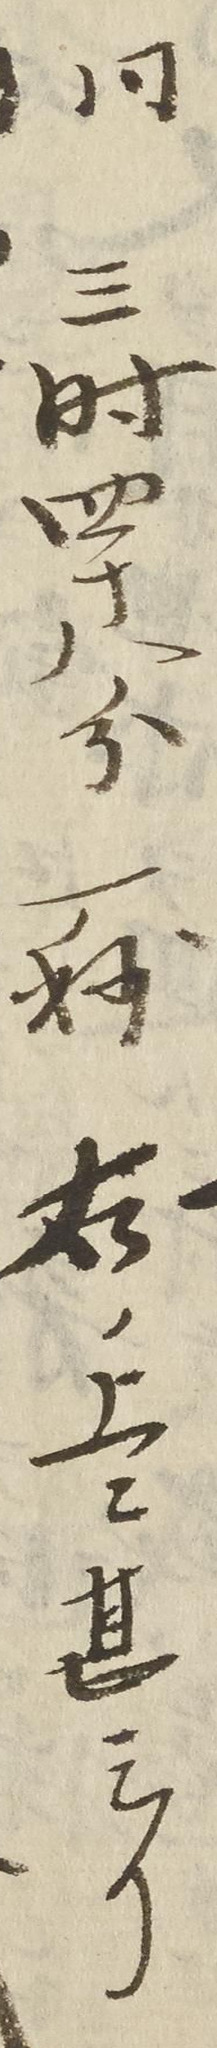同三時四十八分一秒右ノ上二廿ミリ
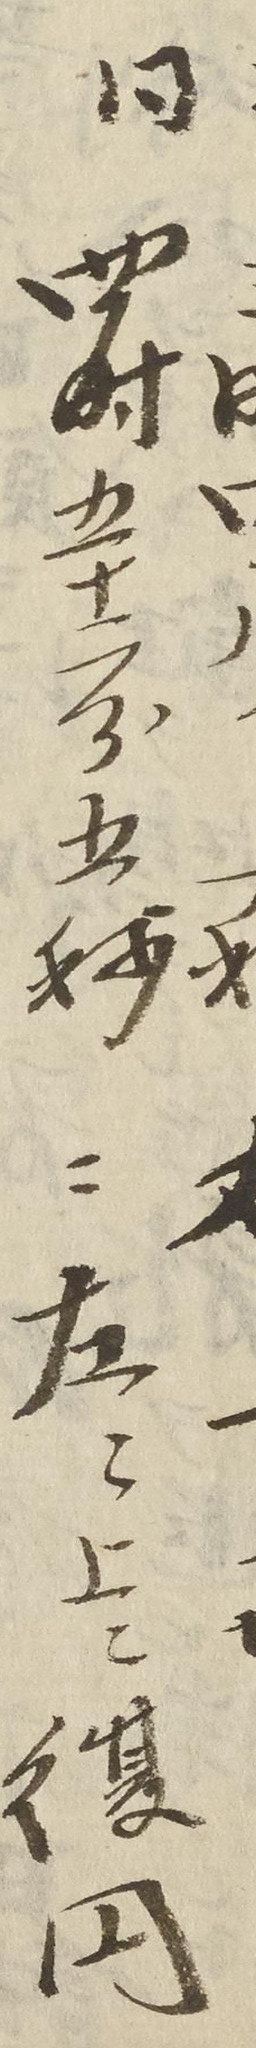同四時五十二分五秒同左二上二復円
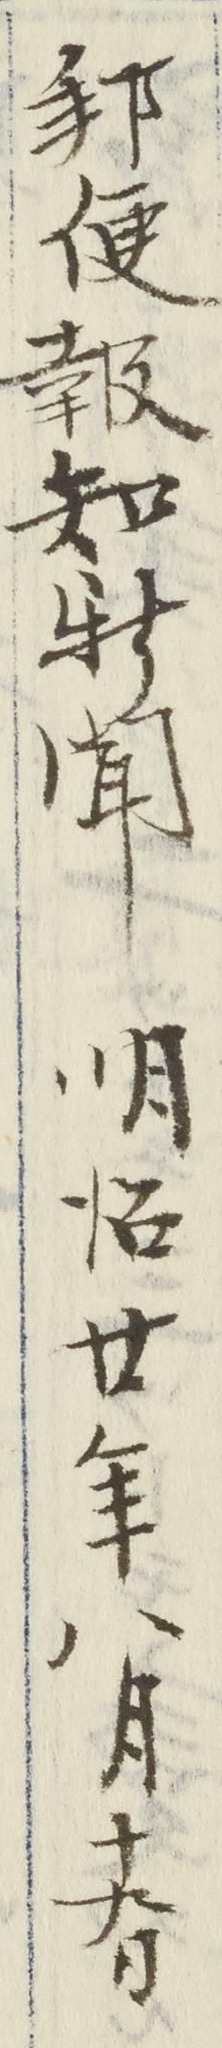郵便報知新聞明治廿年八月十九日
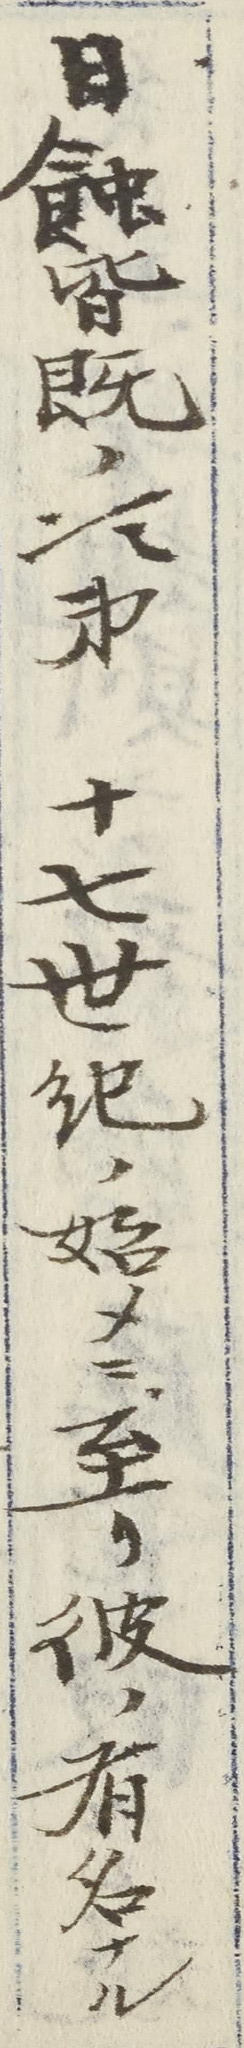日蝕皆既ノ次第十七世紀ノ始メ二至リ彼ノ有名ナル
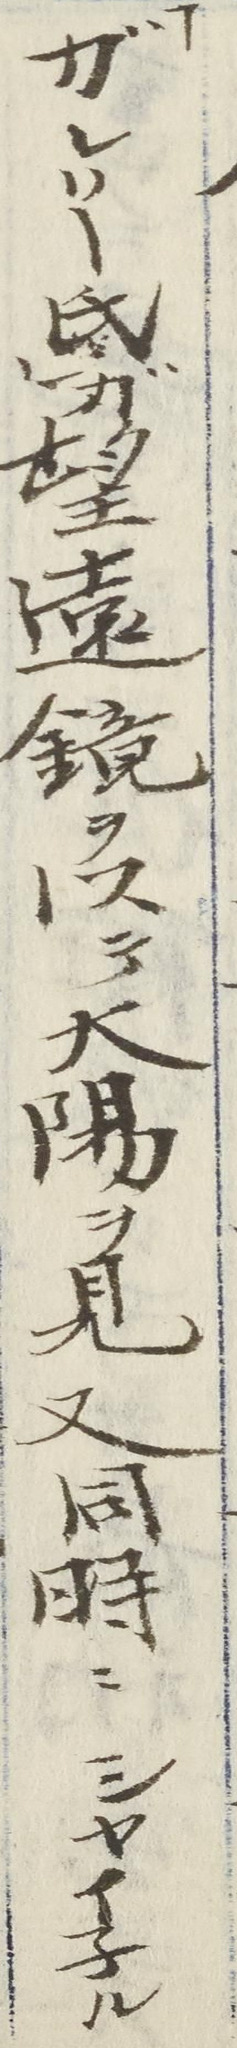「ガレリー氏」ガ望遠鏡ヲ以テ太陽ヲ見又同時二シヤイ子ㇽ
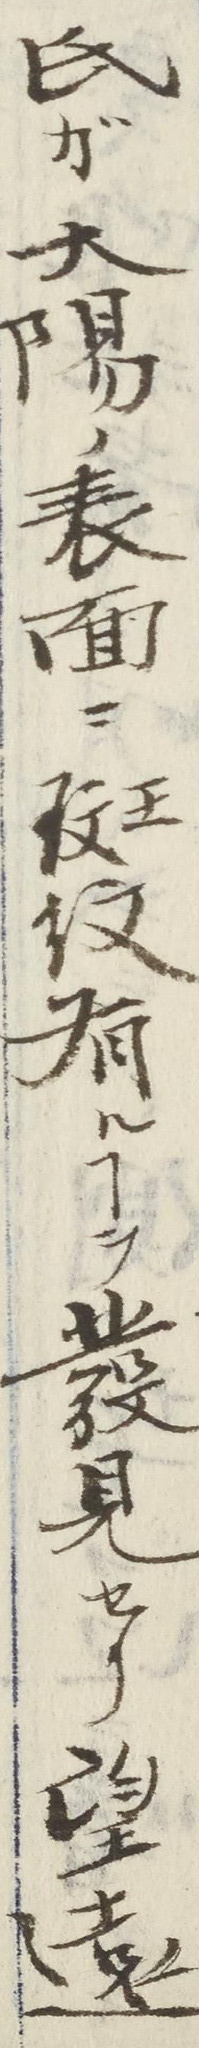氏ガ太陽ノ表面二斑紋有ㇽコトヲ発見セリ望遠
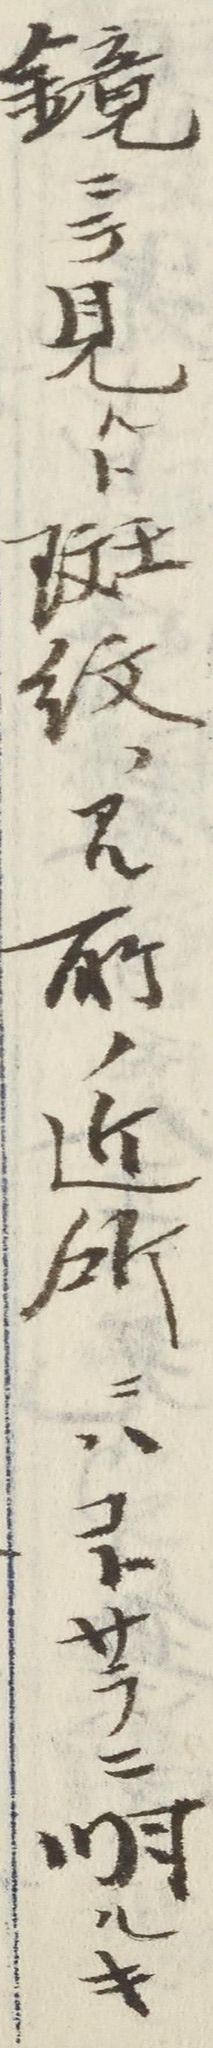鏡ニテ見ルト斑紋ノアル所ノ近所二ハコトサラ二明ㇽキ
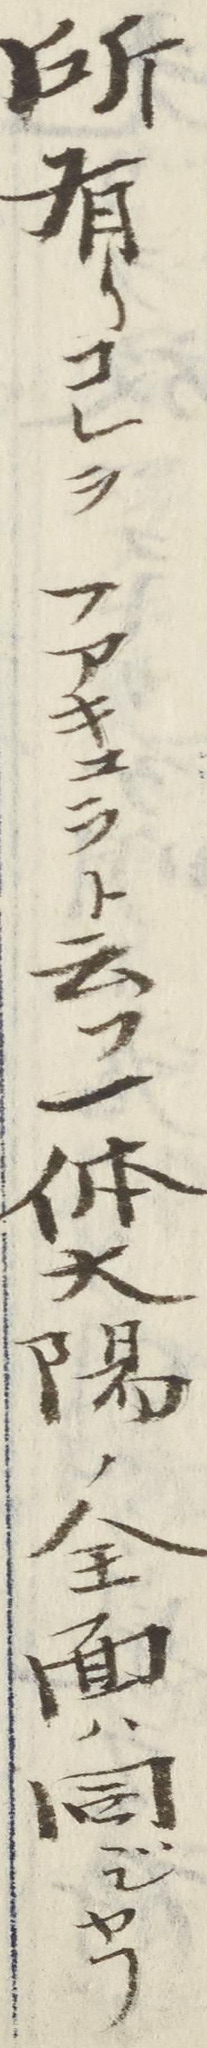所有リコレラフアキユラト云フ一体太陽ノ全面ハ同ジヤフ
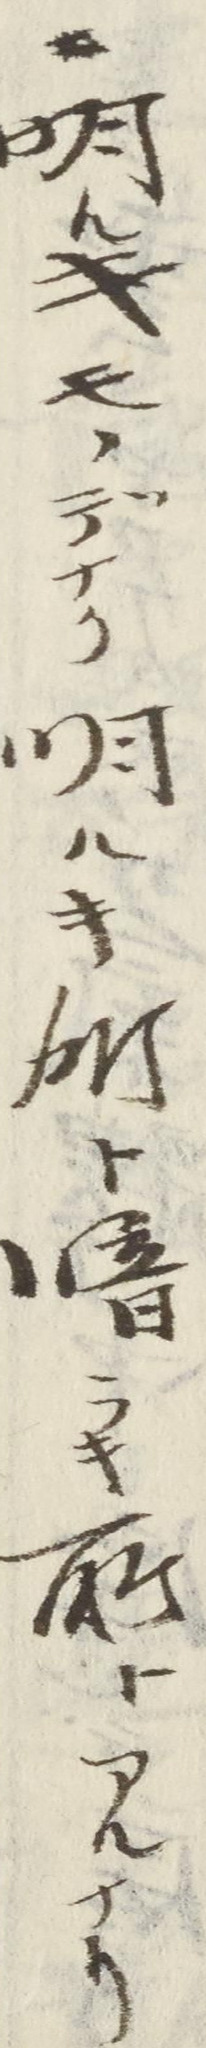二明ㇽキモノデナク明ㇽキ所ㇳ暗ラキ所ㇳアルナリ
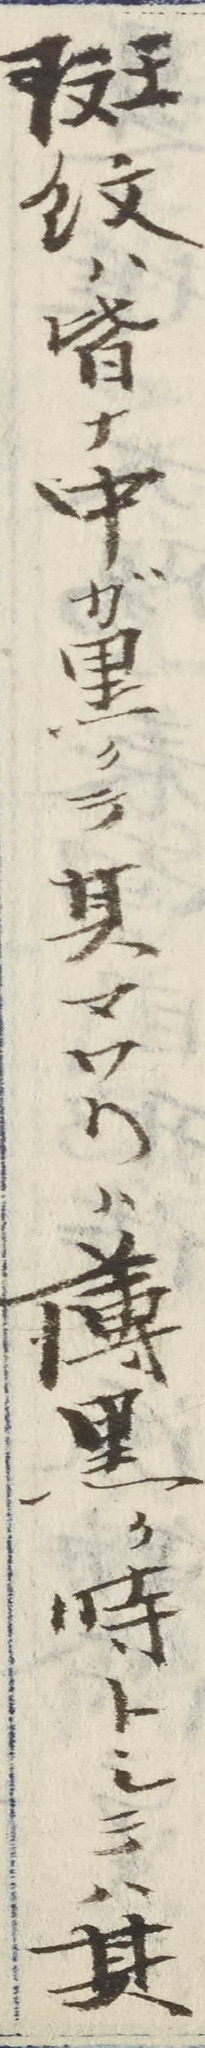斑紋ハ皆ナ中ガ黒クテ其マハリは薄黒ク時ㇳシテハ其
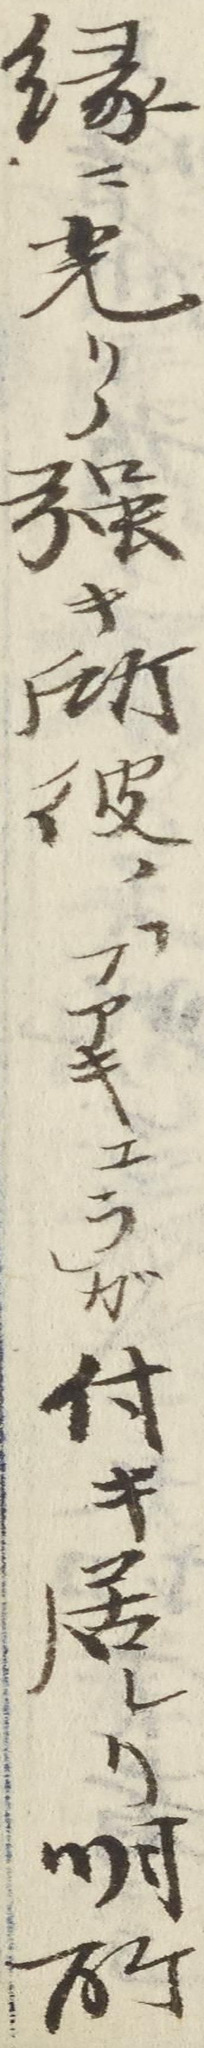縁二光リノ強キ所彼ノ「フアキユラ」ガ付キ居レリ明所

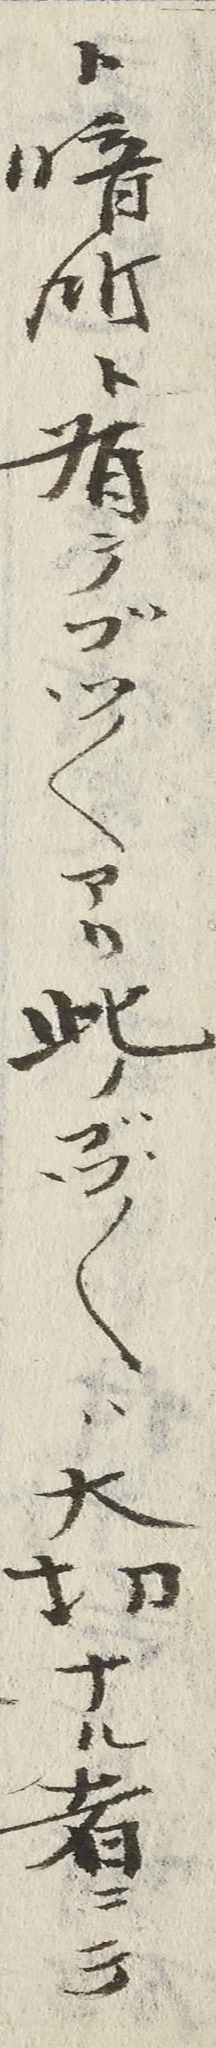ㇳ暗所ㇳ有テブツ〳〵アリ此ノブツ〳〵ハ大切ナル者ニテ
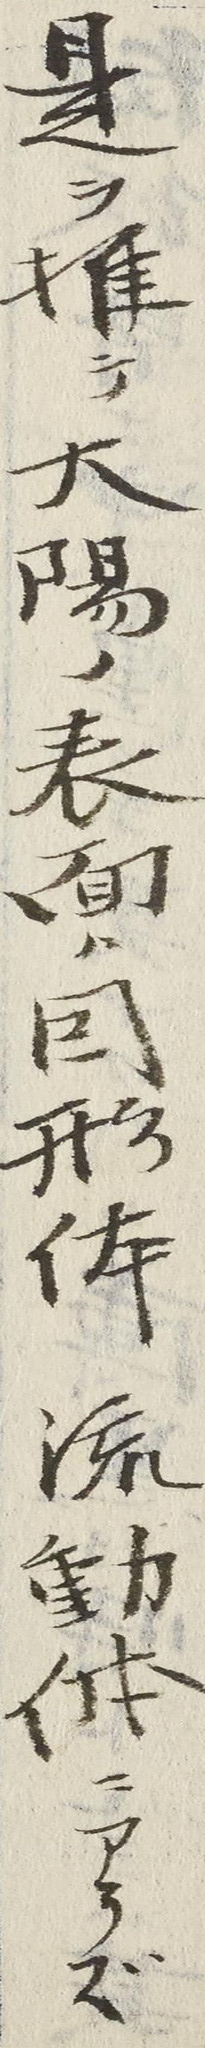是ヲ推テ太陽ノ表面ハ円形体流動体二アラズ
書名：日蝕録　全
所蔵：東京大学地震研究所図書室 Earthquake Research Institute Library, The University of Tokyo, JAPAN
